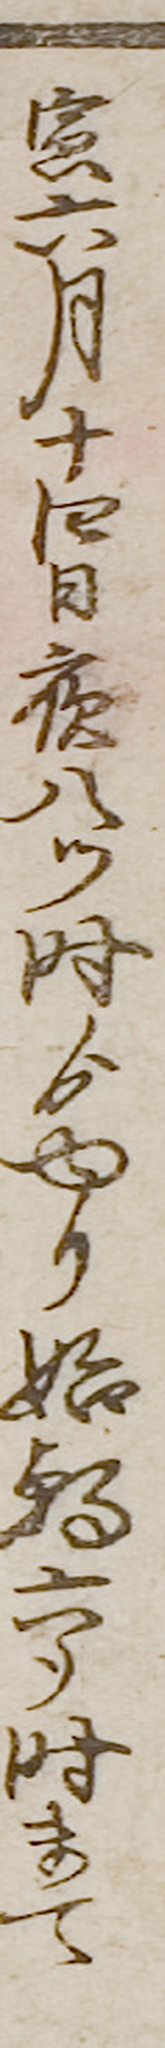寅六月十四日夜八ッ時よりゆり始朝六ッ時まて
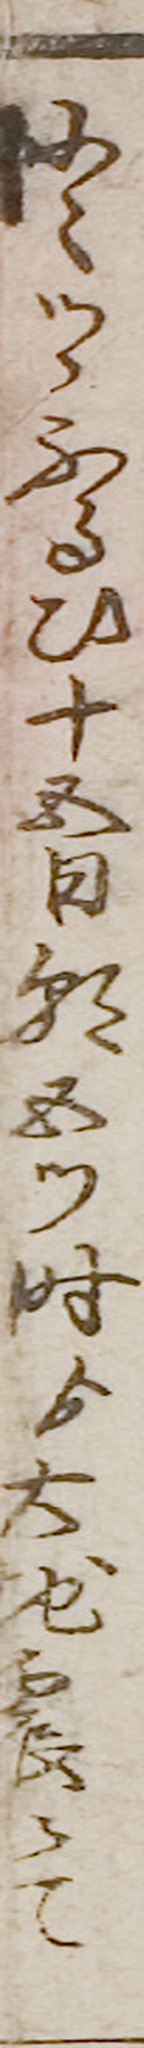少々つゝふるひ十五日朝五ッ時より大地震にて
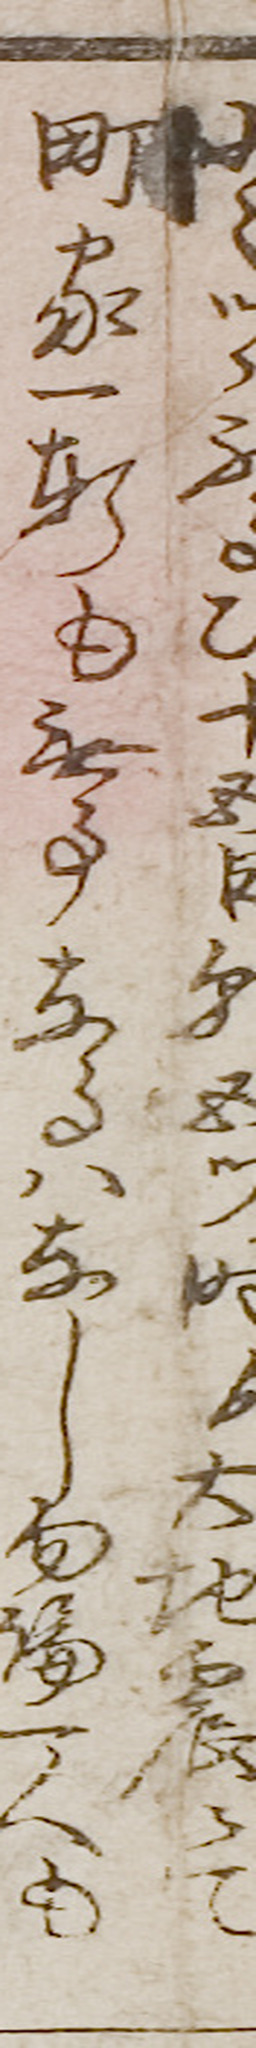町家一軒も無事なるはなし勿論一人も
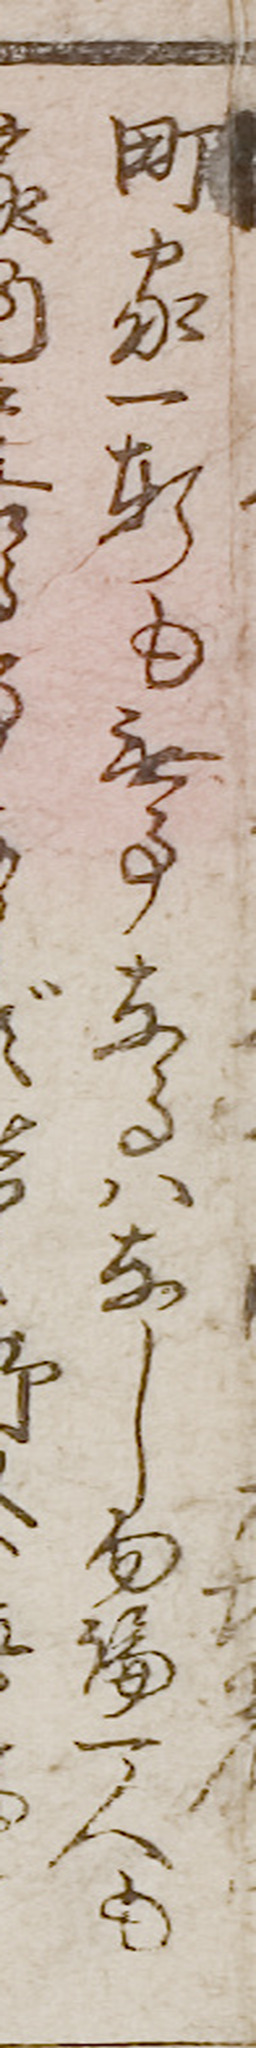家内に居る事ならず皆々野又は興福寺
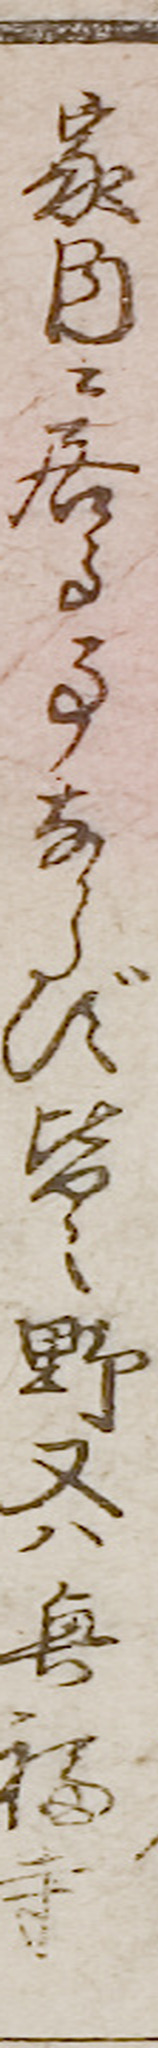家内に居る事ならず皆々野又は興福寺
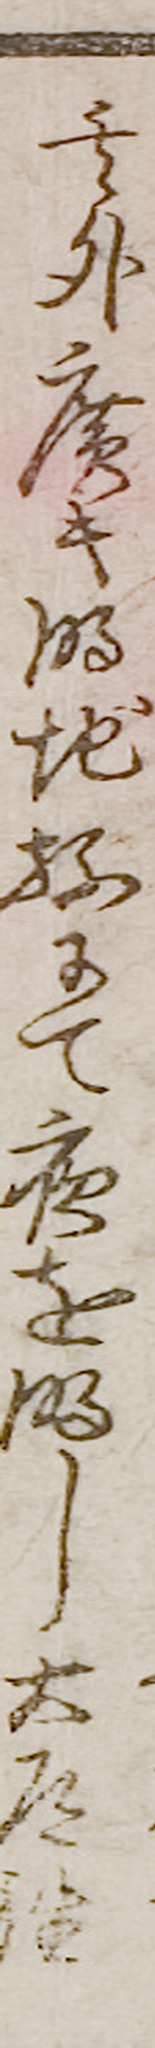其外広き明地等にて夜を明し大道往
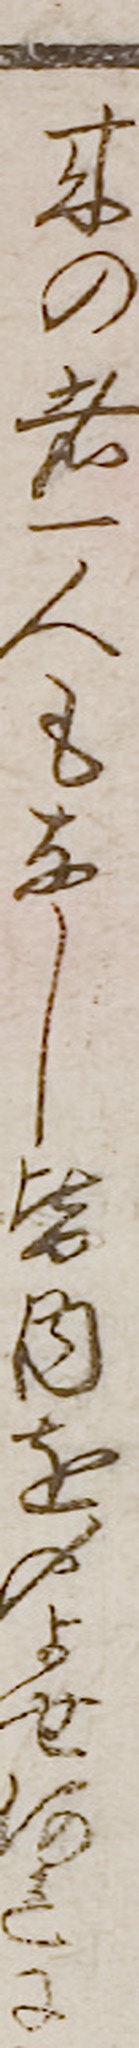来の者一人もなし皆内を〆よせ何れに
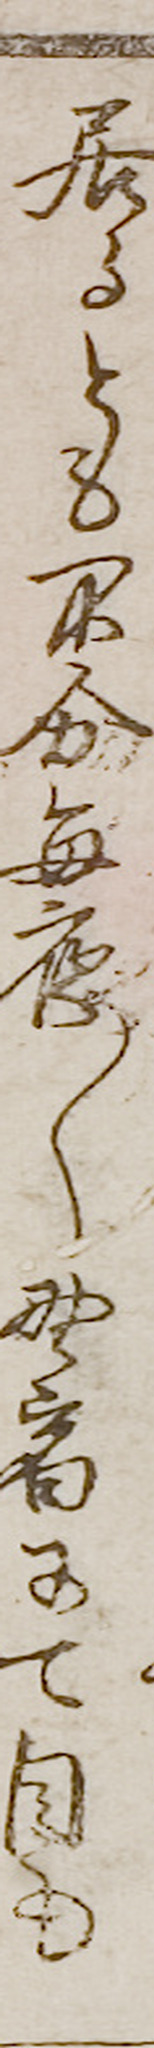居るとも不分毎夜〳〵野宿にて目も
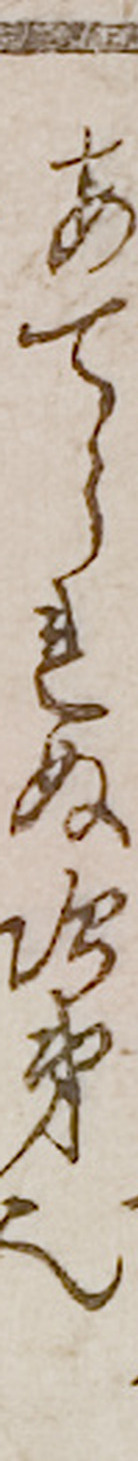あてられぬ次第也
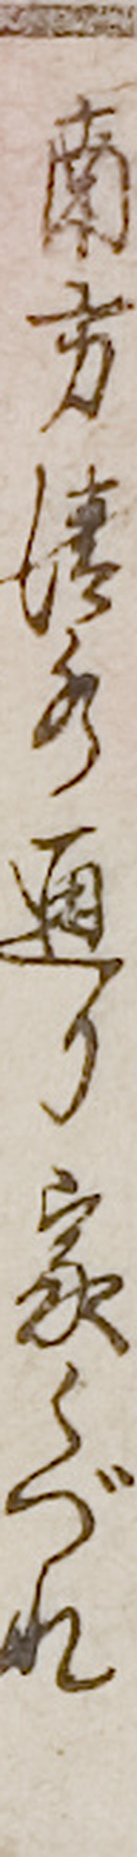南方清水通り家くづれ
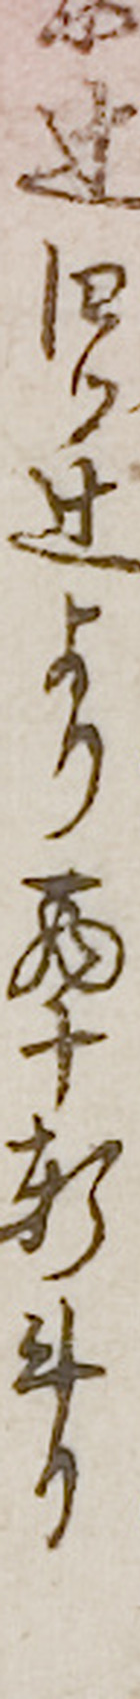本辻四ッ辻より西十軒斗り
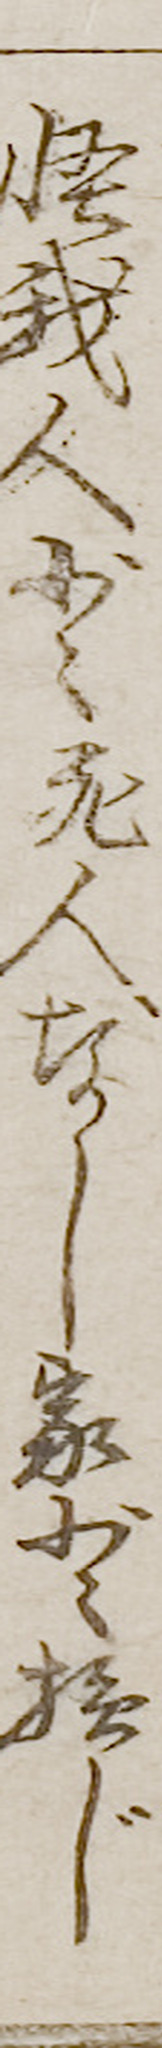怪我人少々死人なし家少々損じ
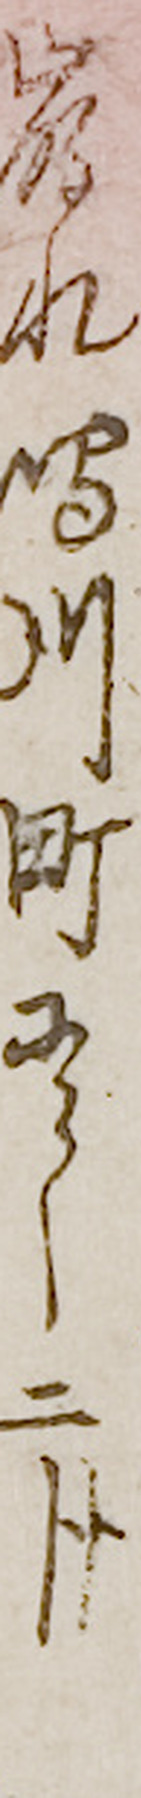崩れ鳴川町にて二分
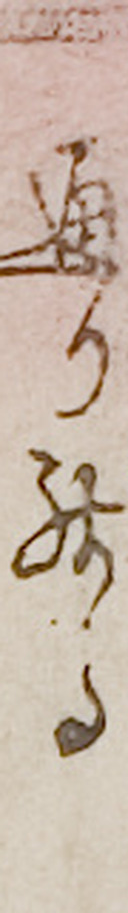通り残る
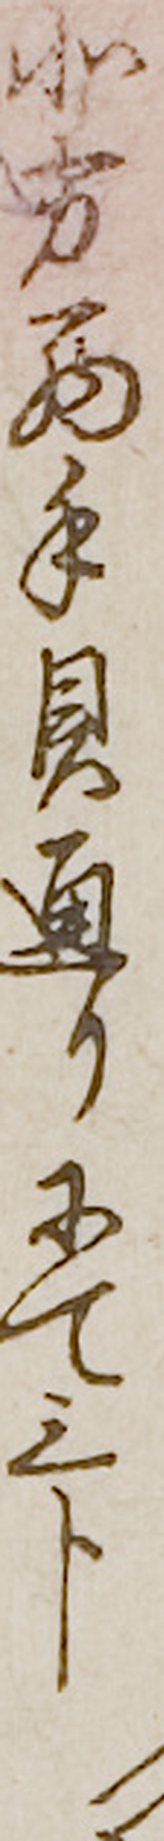北方西手貝通りにて三分
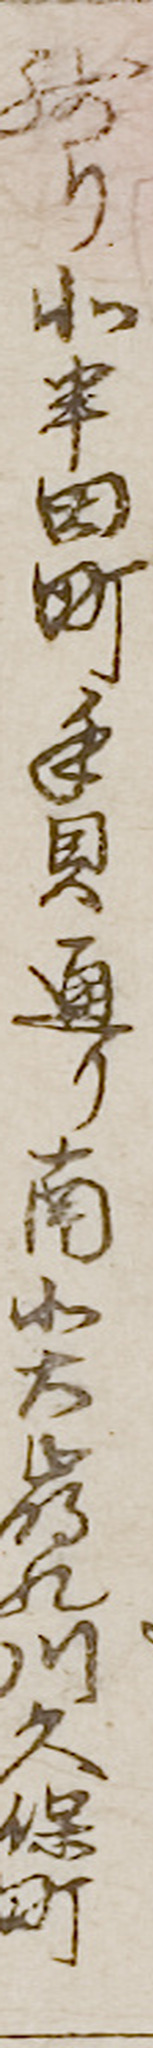残り北半田町手貝通り南北大崩れ川久保町
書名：聞書諸国大地震并出火
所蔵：東京大学総合図書館 General Library in the University of Tokyo, JAPAN
